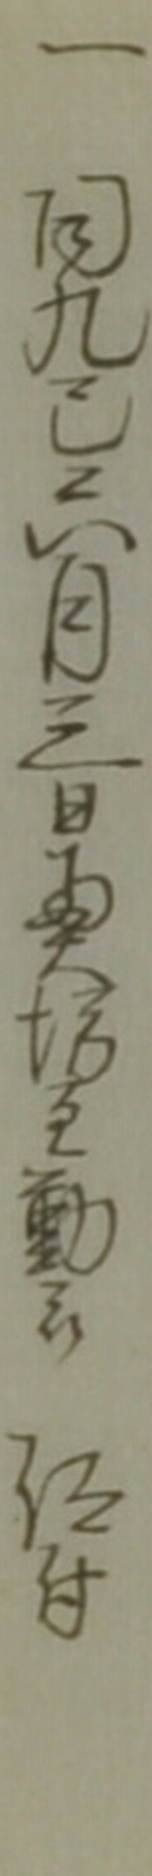一同九巳六月三日奥坊主勤被仰付
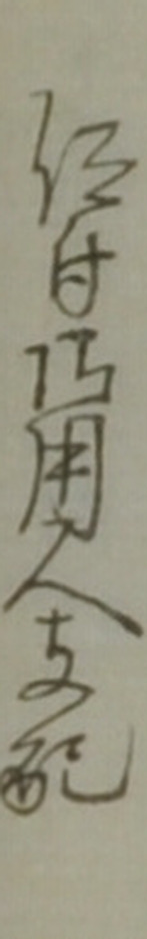仰付御用人支配

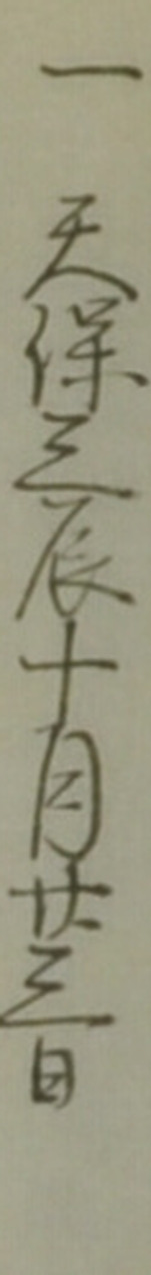一天保三辰十月廿三日
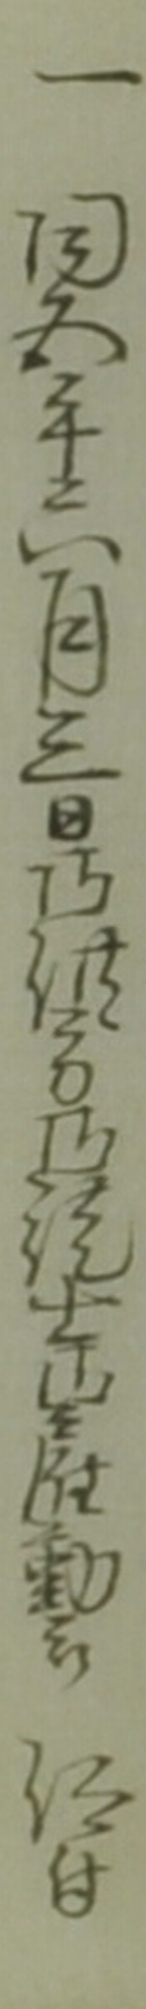一同五午六月三日御供方御徒士御雇勤被仰付
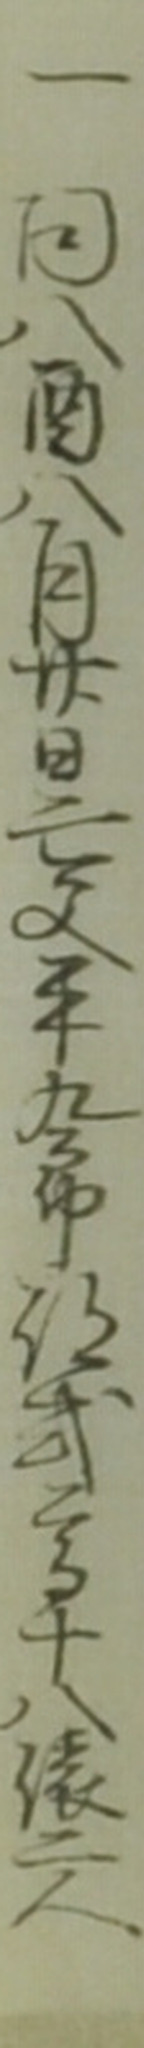一同八酉八月廿日亡父平九郎跡式高十八俵二人

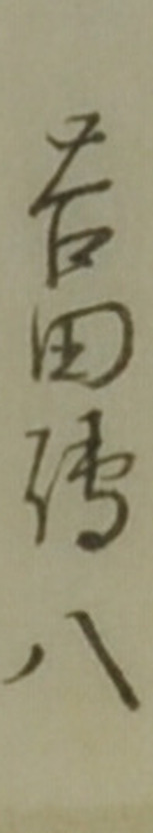吉田伝八
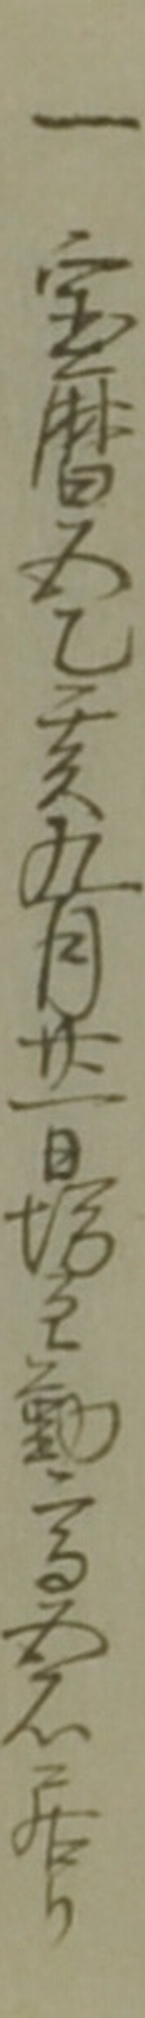一宝暦五乙亥九月廿一日坊主勤高五石居り
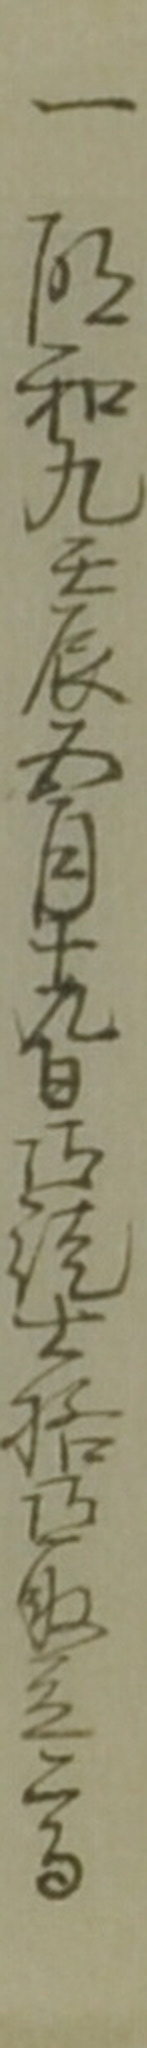一明和九壬辰五月十九日御徒士格御取立高
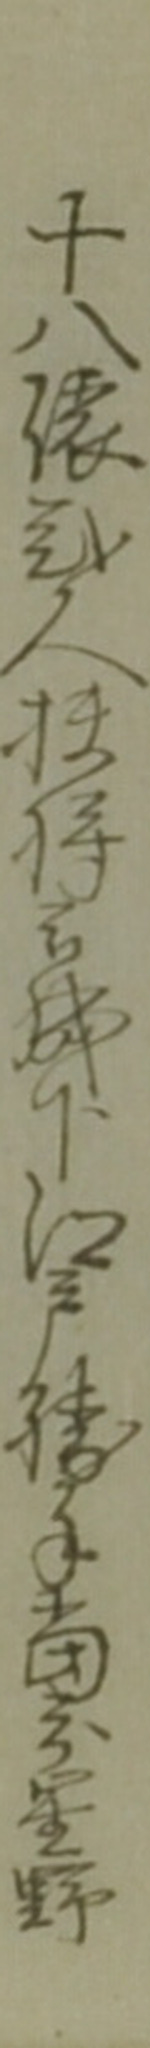十八俵弐人扶持被成下江戸勝手当分星野
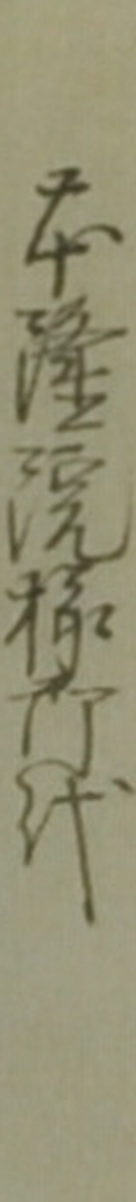本隆院様御代
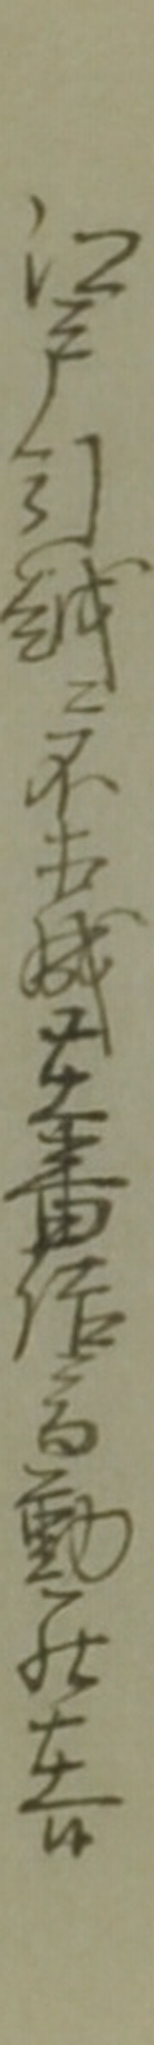江戸引越ニ不相成在番詰ニ而勤罷在候
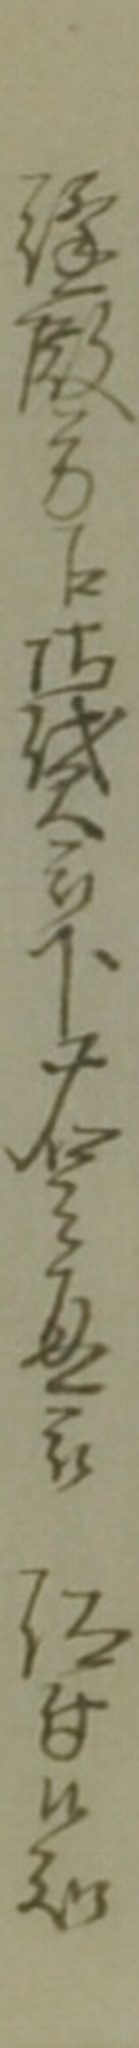縫殿方江御貸被下右之通被仰付候処
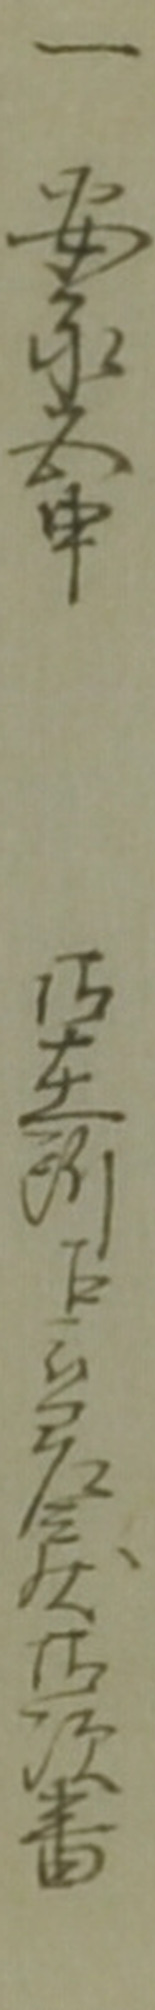一安永五申御在所江被差戻御次番
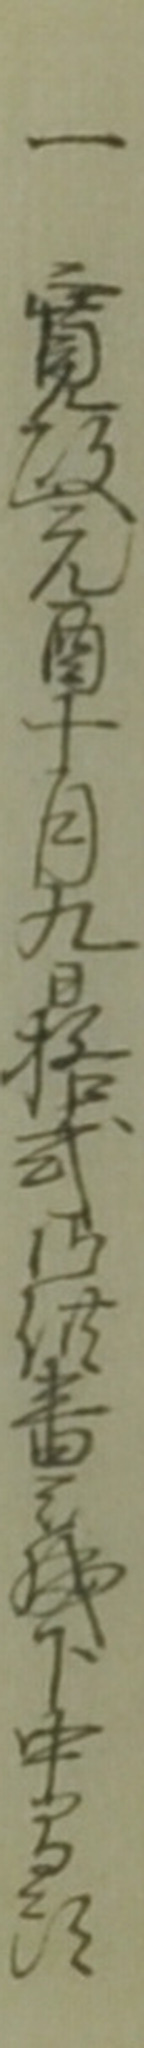一寛政元酉十月九日格式御供番被成下中間頭
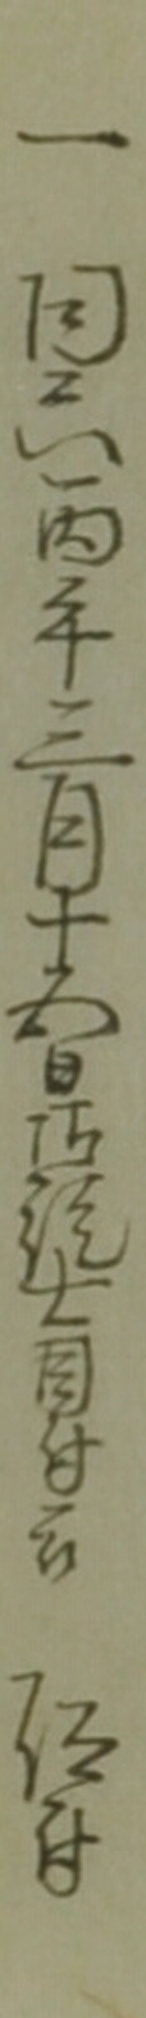一同六丙午三月十五日御徒士目付被仰付
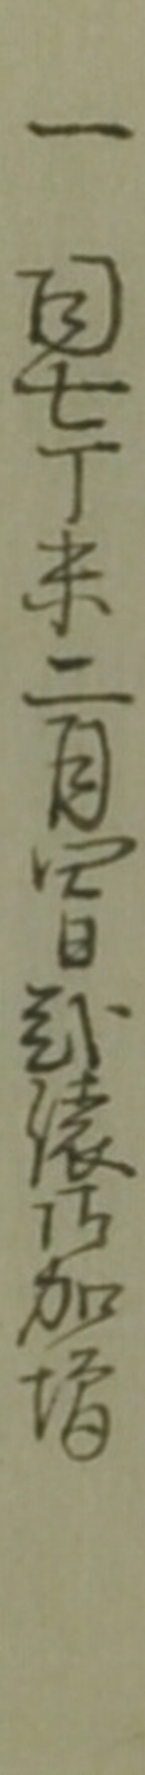一同七丁未二月四日弐俵御加増
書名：無足諸士勤仕録（三）
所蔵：伊那市立高遠町図書館・合同会社AMANE
